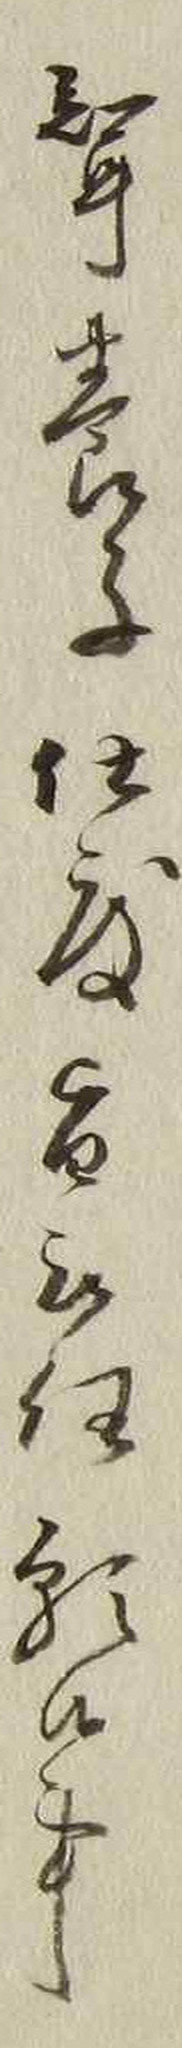聟養子仕度旨被任願候事
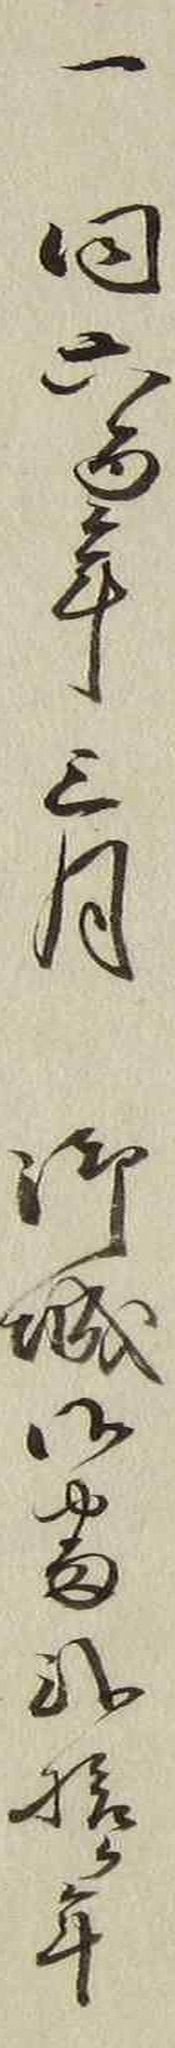一同六酉年三月御城御番弐拾ケ年
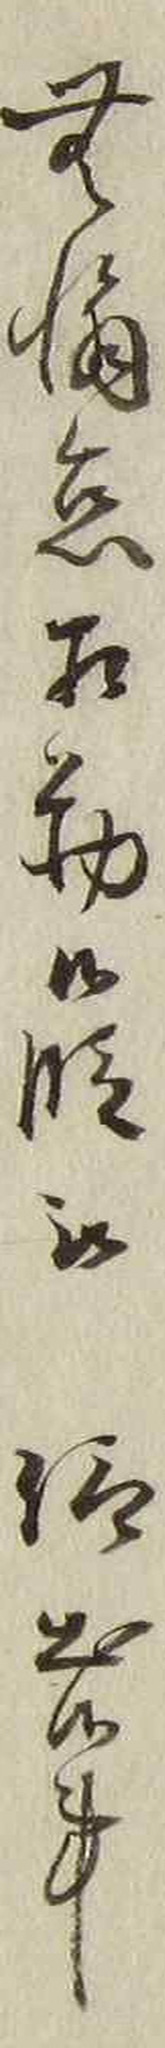無懈怠相勤候段被仰出候事

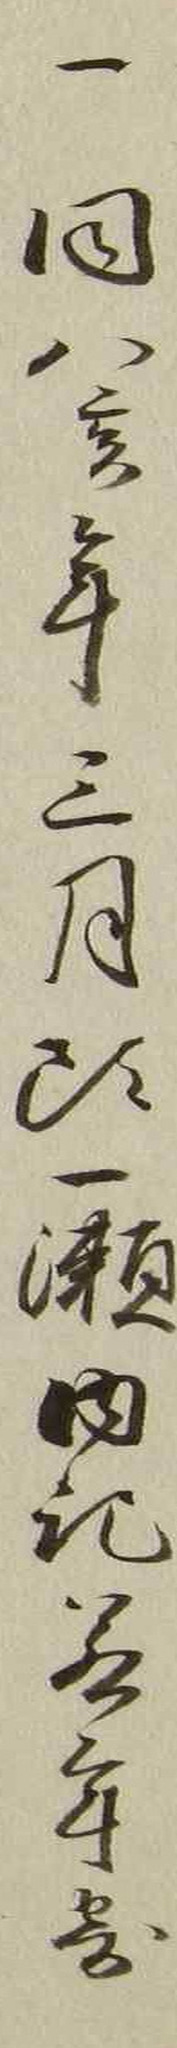一同八亥年三月頭一瀬内記若年寄
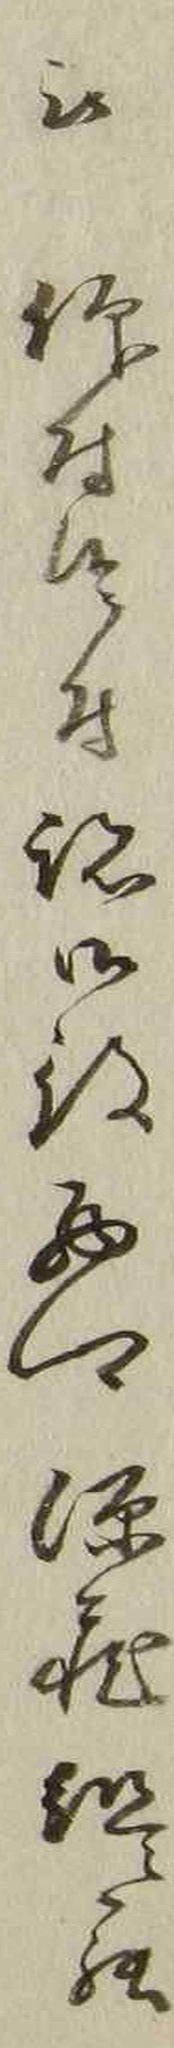被仰付候ニ付跡御役西郷源蔵組ニ罷
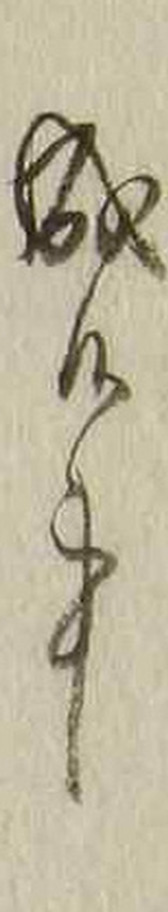成候事
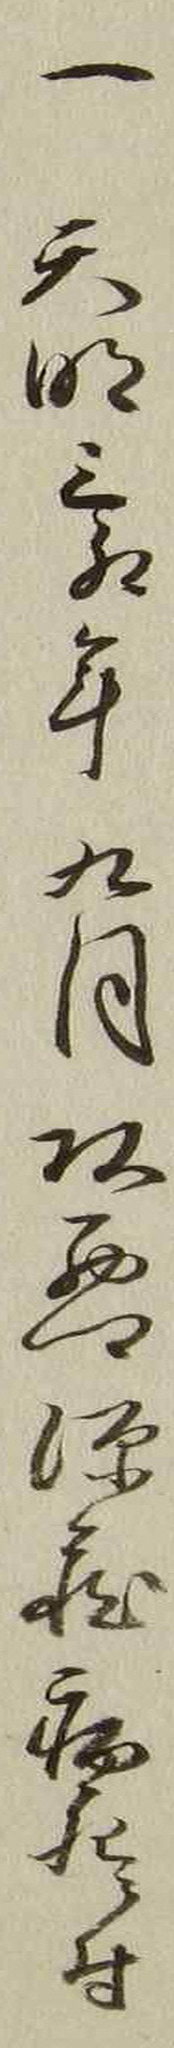一天明三卯年九月頭西郷源蔵病死ニ付
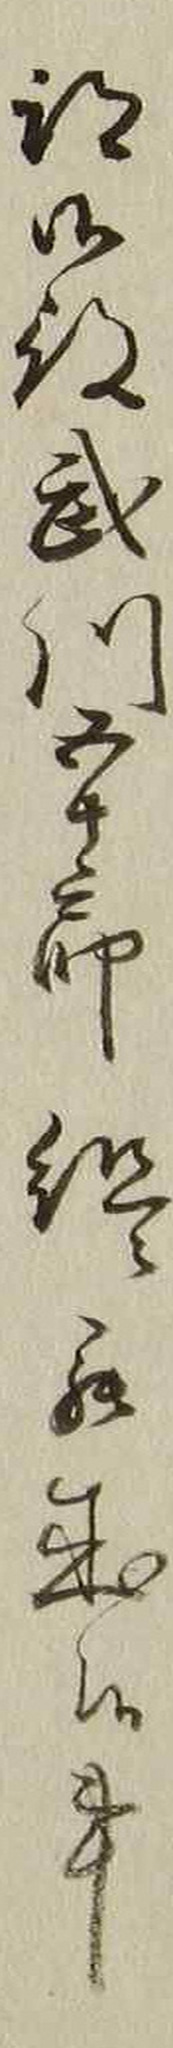跡御役武川五十郎組ニ罷成候事
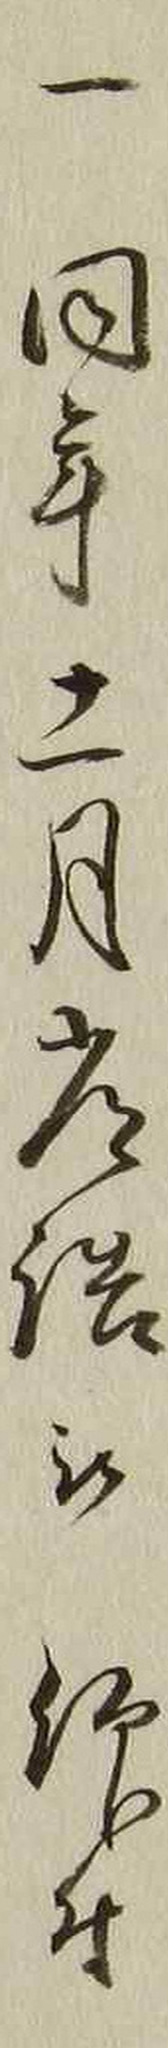一同年十一月常詰被仰付
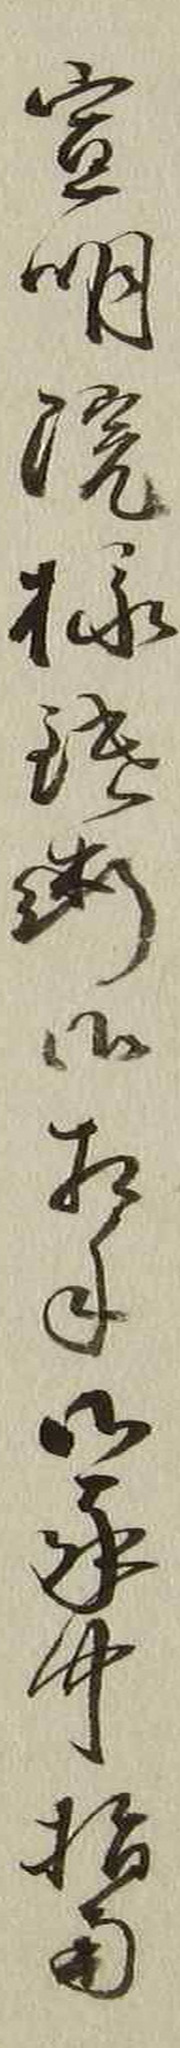宣明院様鑓術御相手御承中指南
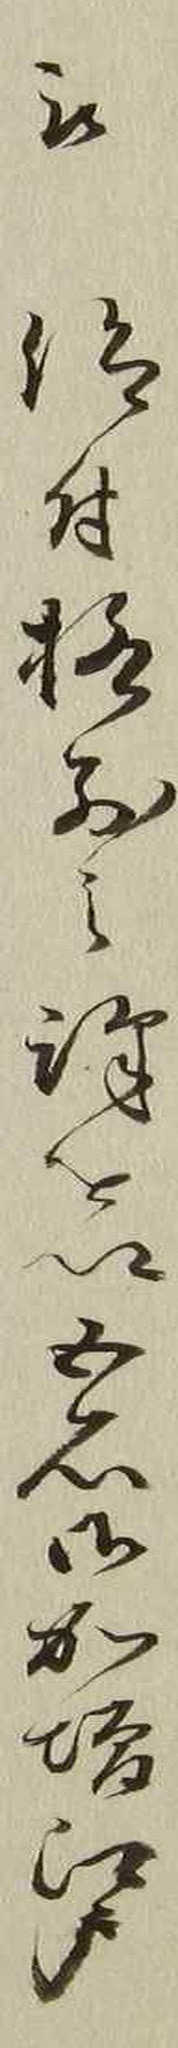被仰付格別之訳を以五石御加増江戸
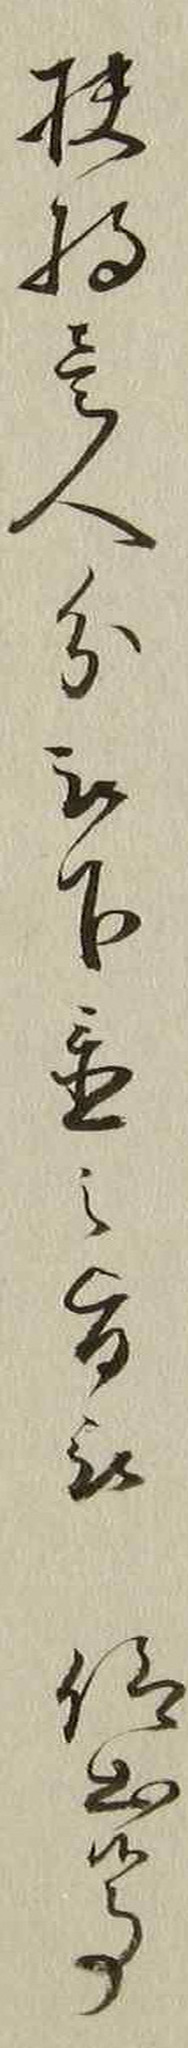扶持壱人分被下置之旨被仰出候事
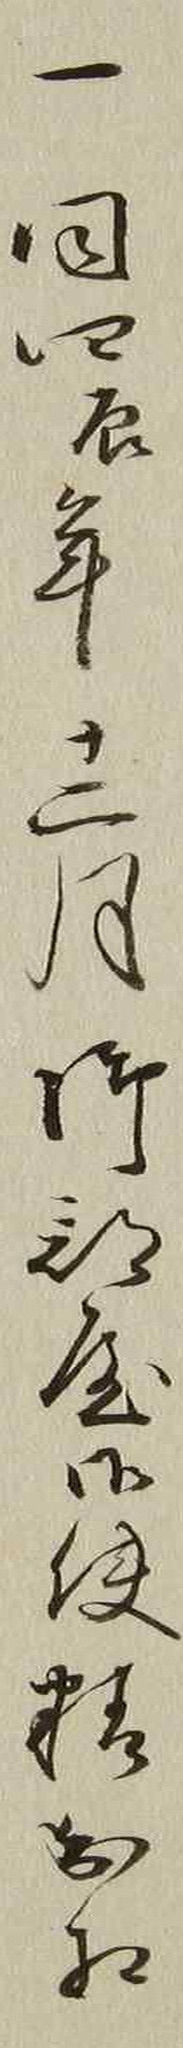一同四辰年十二月御部屋御使精出相
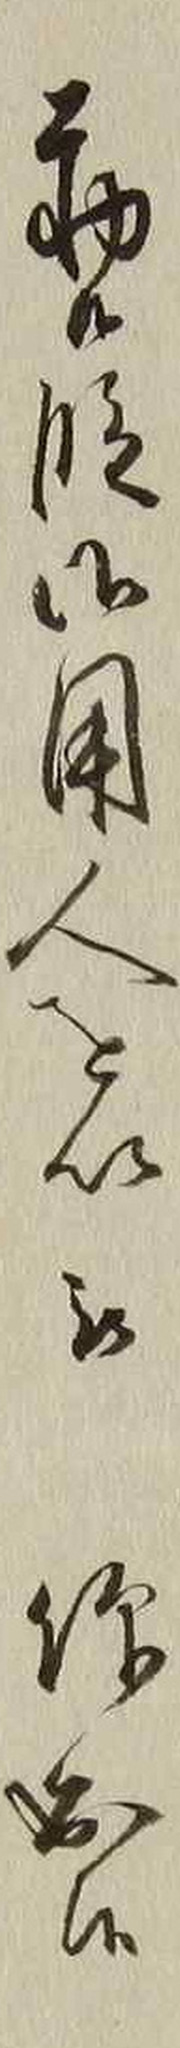勤候段御用人を以被仰出候
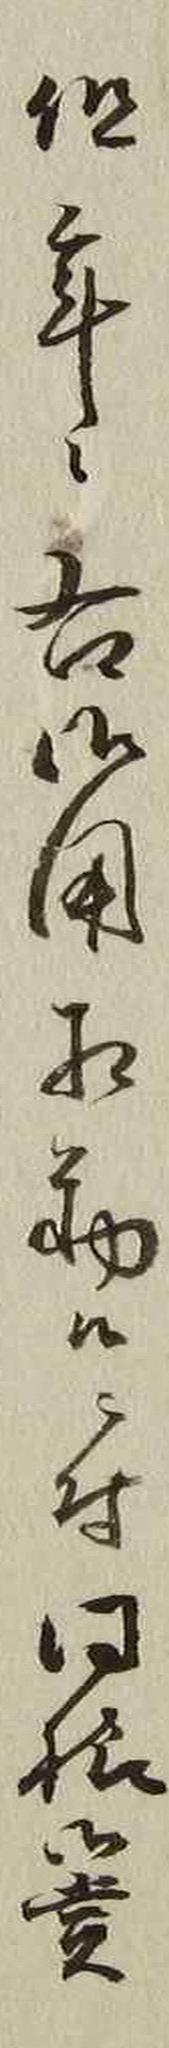但年々右御用相勤候ニ付同様御賞
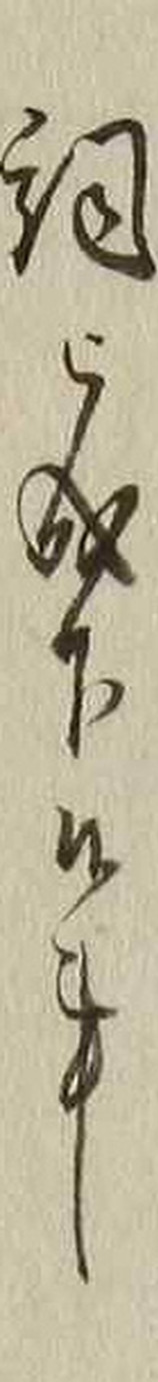詞被成下候事
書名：諸士系譜　巻之28　い之部28
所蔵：会津若松市立会津図書館
